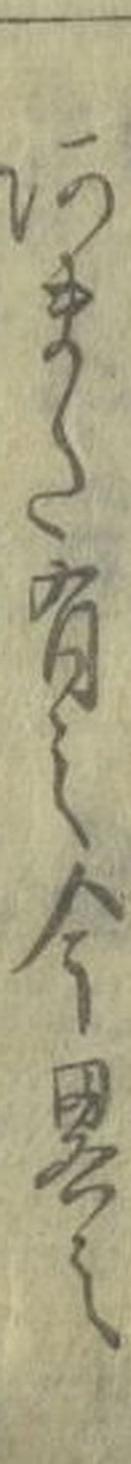あまた有之今略之
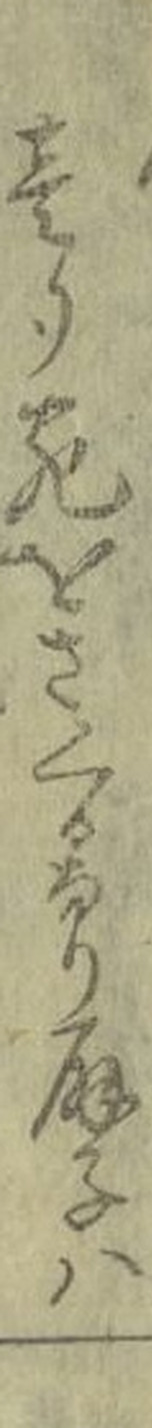壱つ宛をさくるなり辟子は
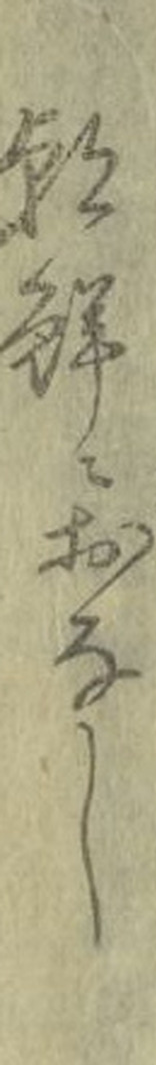朝鮮におなし
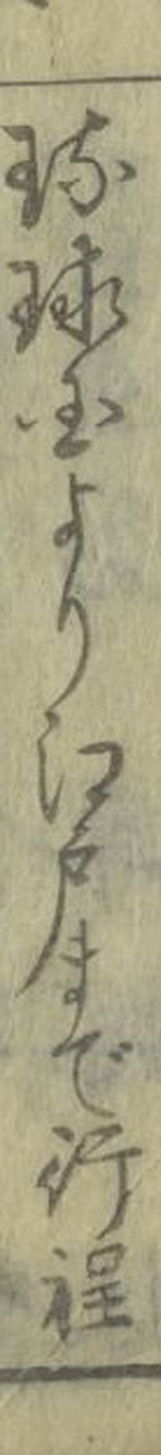琉球国より江戸まで行程
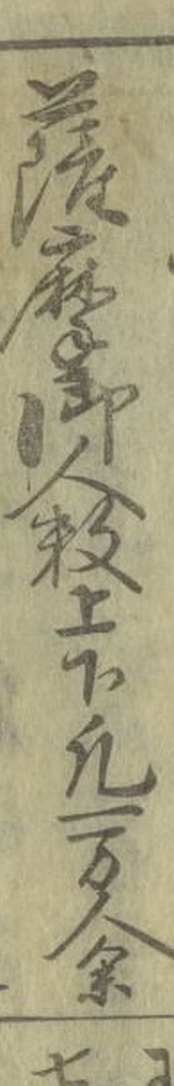薩摩御人数上下凡一万人余
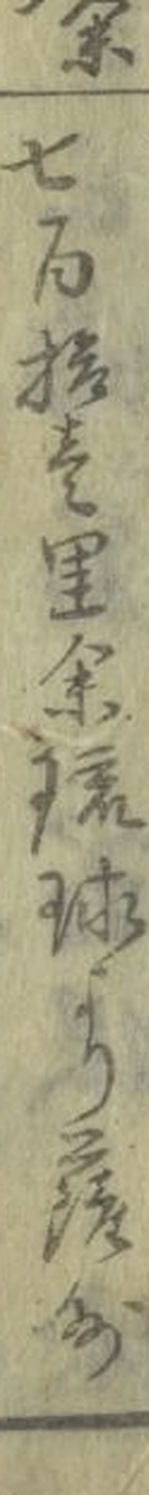七百拾壱里余琉球より薩州
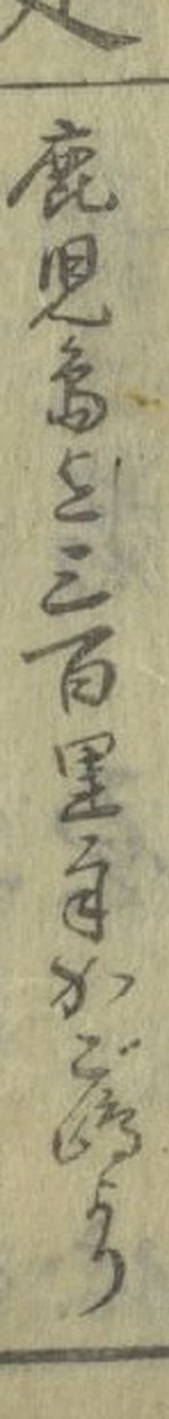鹿児島迄三百里余かご嶋より
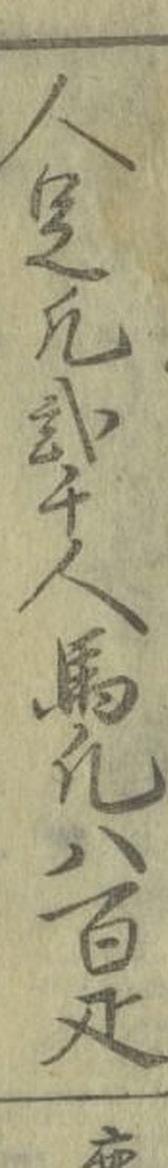人足凡弐千人馬凡八百疋
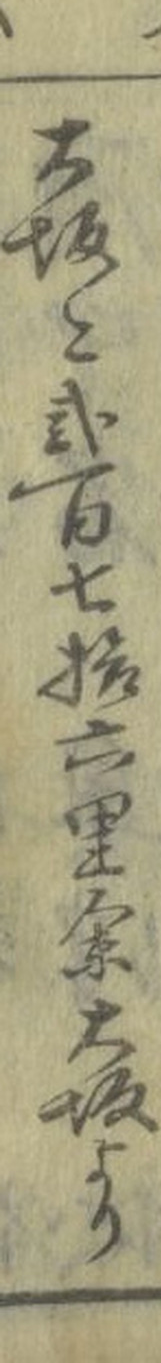大坂迄二百七拾六里余大坂より
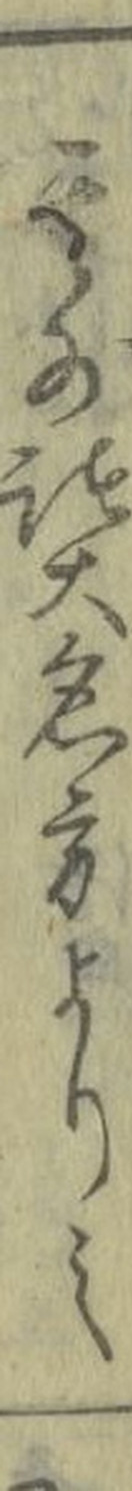其外諸大名方より之
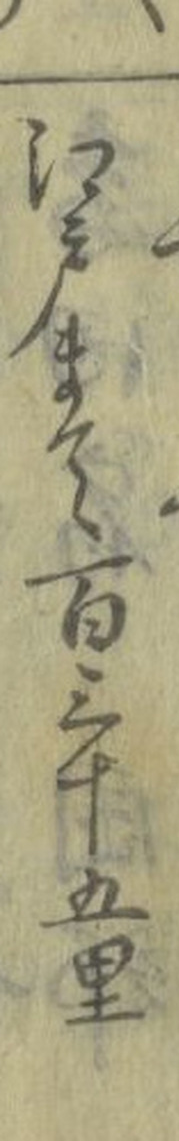江戸まて百三十五里
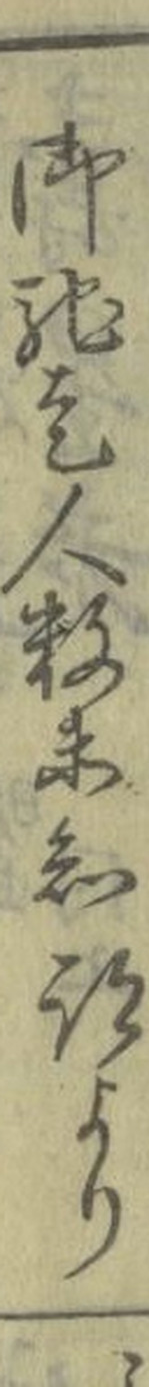御馳走人数未知跡より
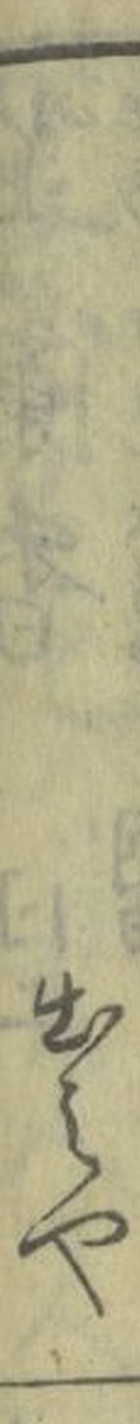出之也
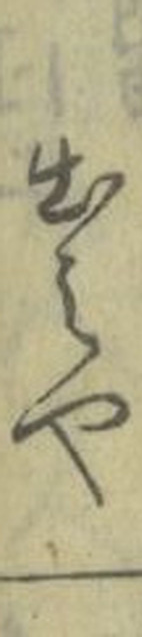出之也
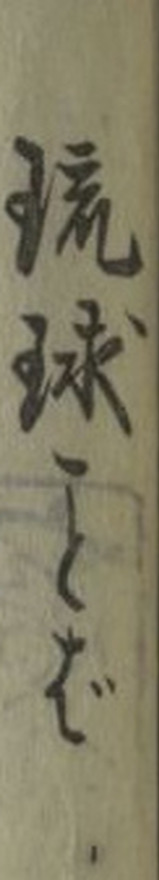琉球ことば
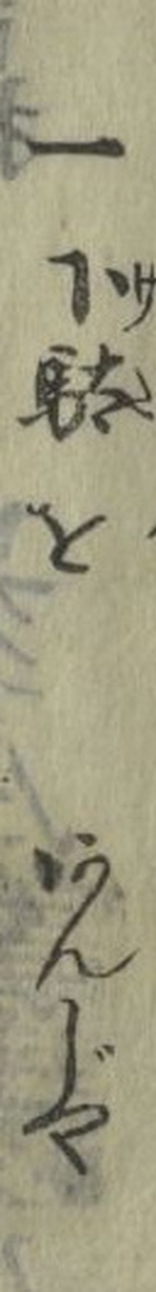一下駄をあんじや
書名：琉球人行列記
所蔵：University of the Ryukyus Library
